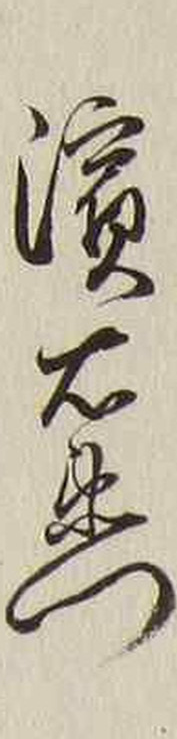栢右衛門

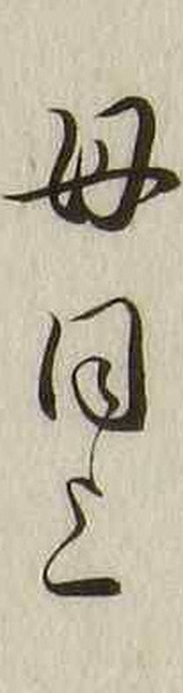母同上
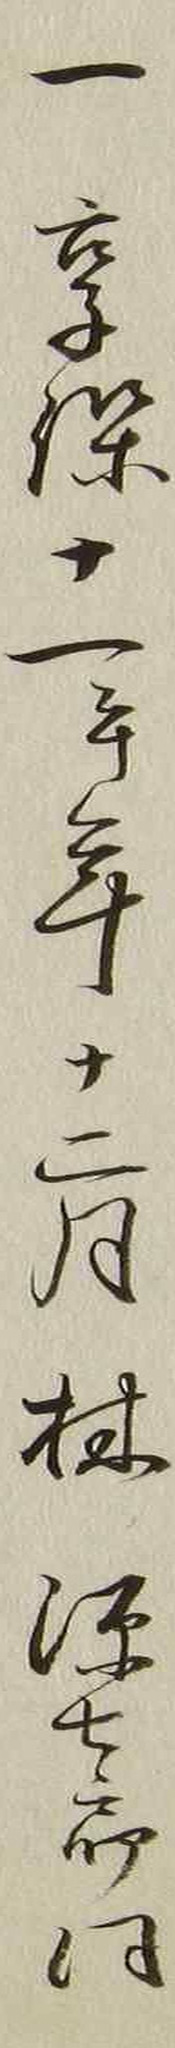一享保十一午年十二月林源七郎同
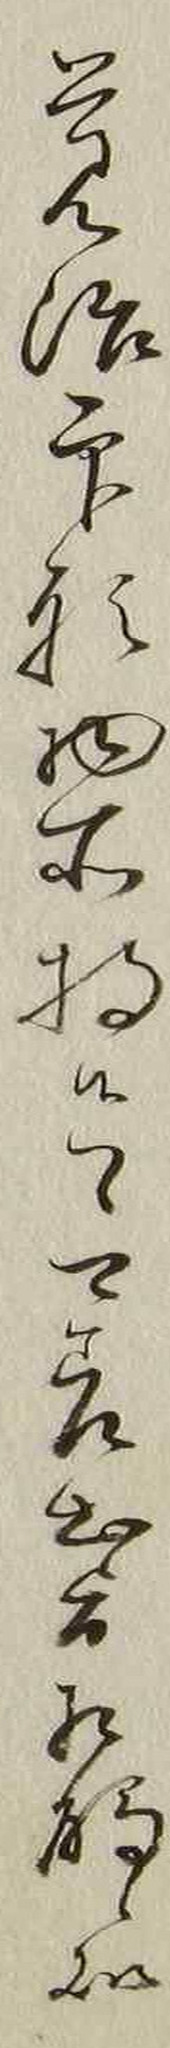覚治印形物所持候ハバ差し出候旨相触れ候処
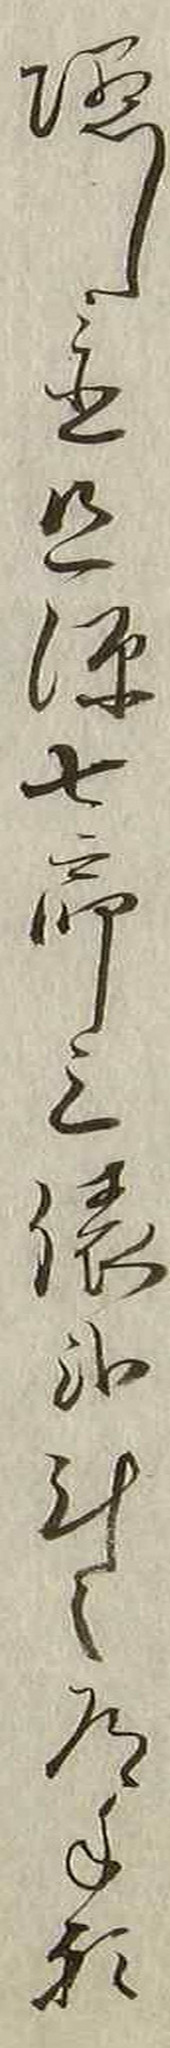隠し置き且つ源七郎三俵弐斗之道手形
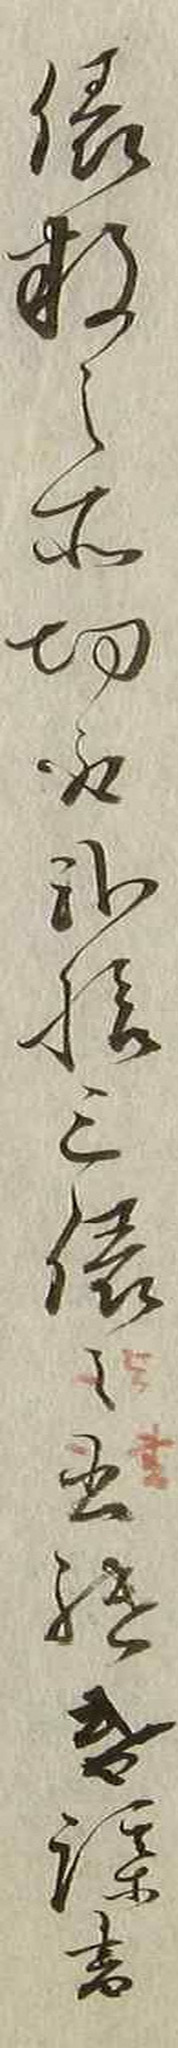俵数之処切取り弐拾三俵之書繾紙謀書
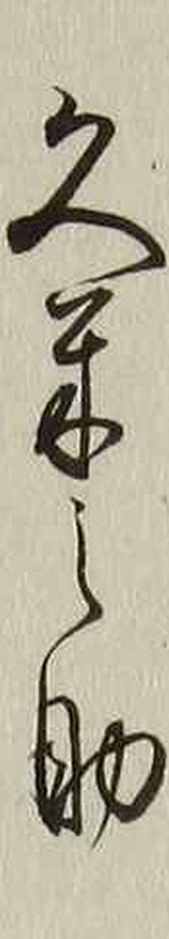久米之助
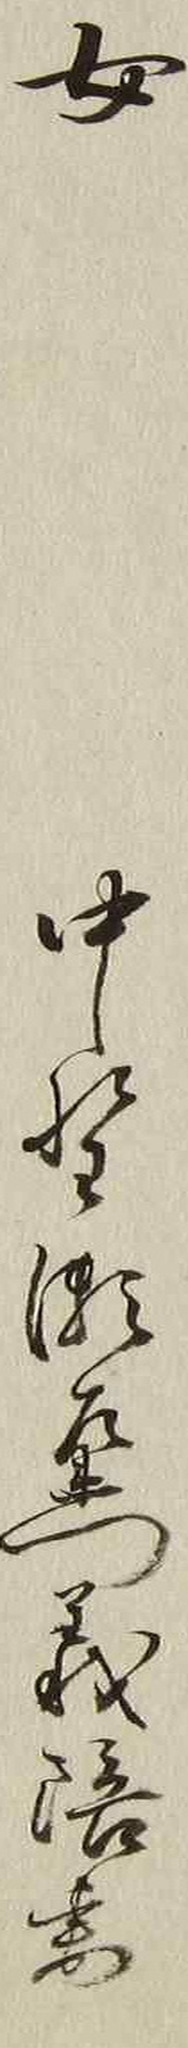女中野瀬左衛門義陪妻
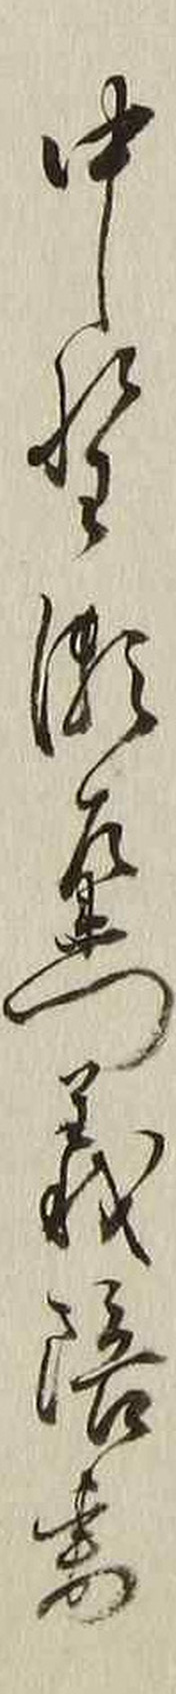女中野瀬左衛門義陪妻
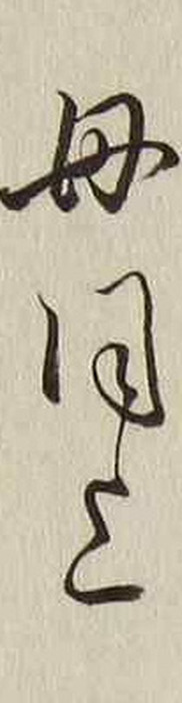母同上

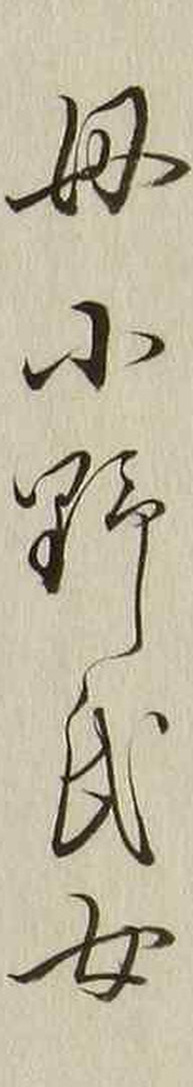母小野氏女
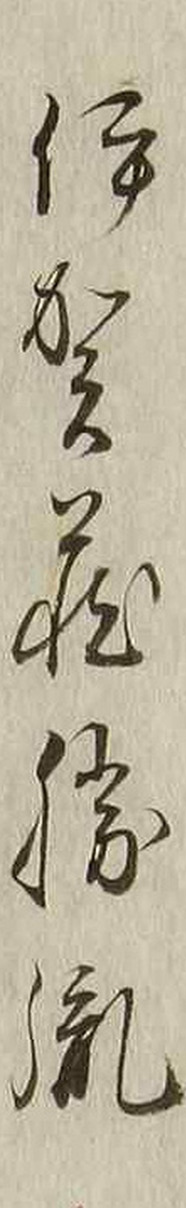伊賀蔵勝胤
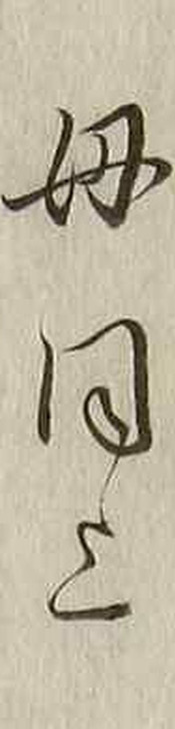母同上
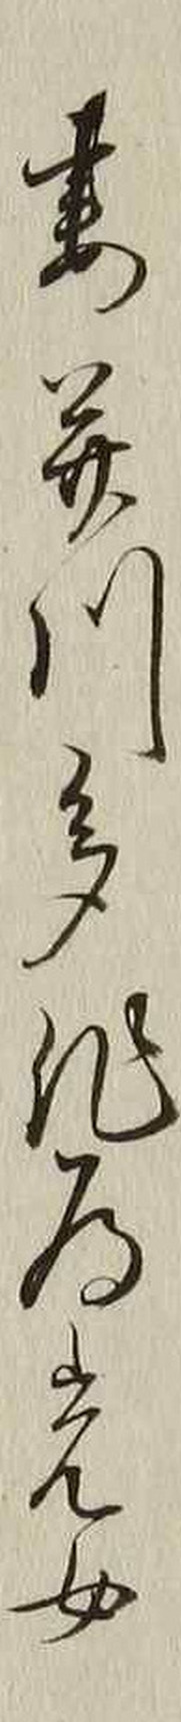妻并川多作為光女
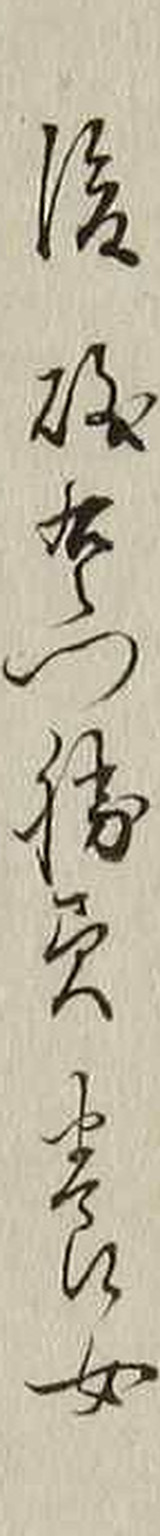後磯右衛門勝美養女
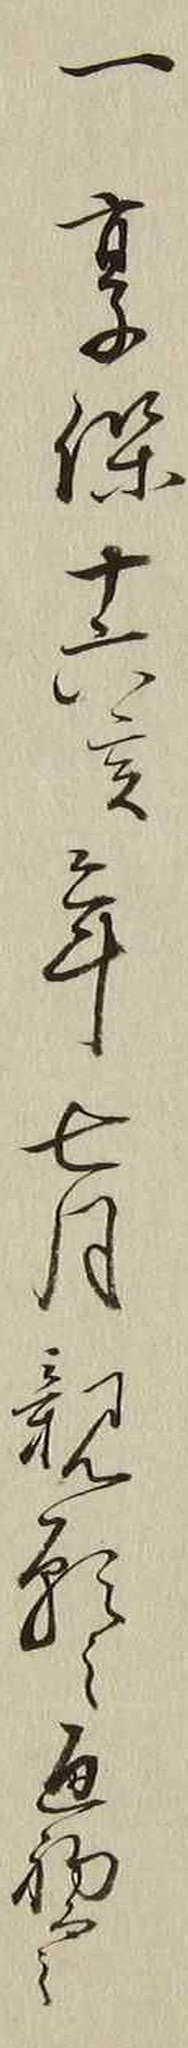一享保十六亥年七月親願い之通初めて之
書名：諸士系譜　巻之20　い之部20
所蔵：会津若松市立会津図書館
